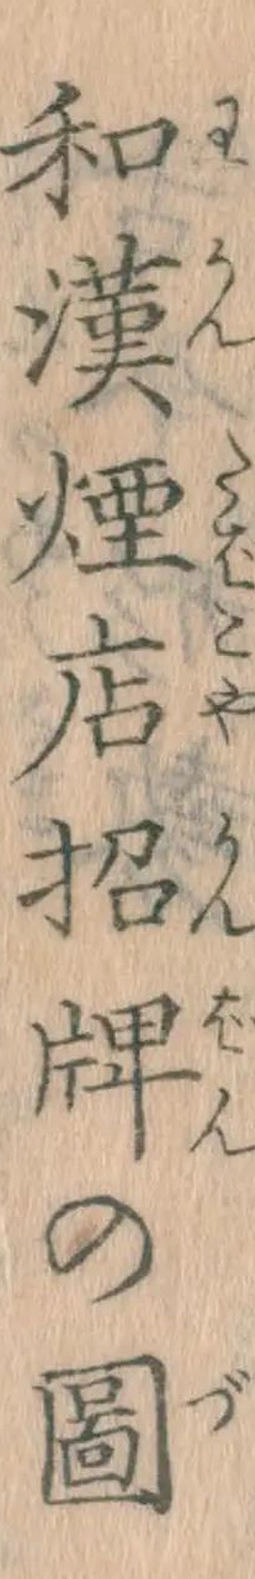和漢煙店招牌の図
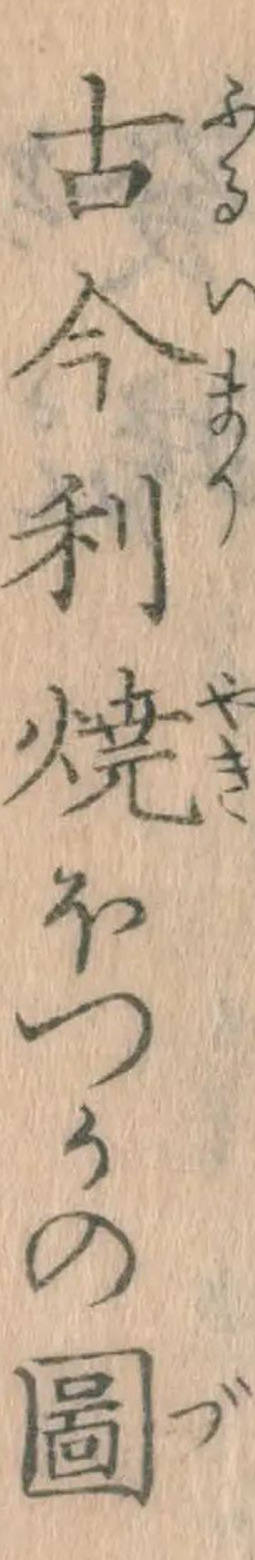古今利焼ほつかの図
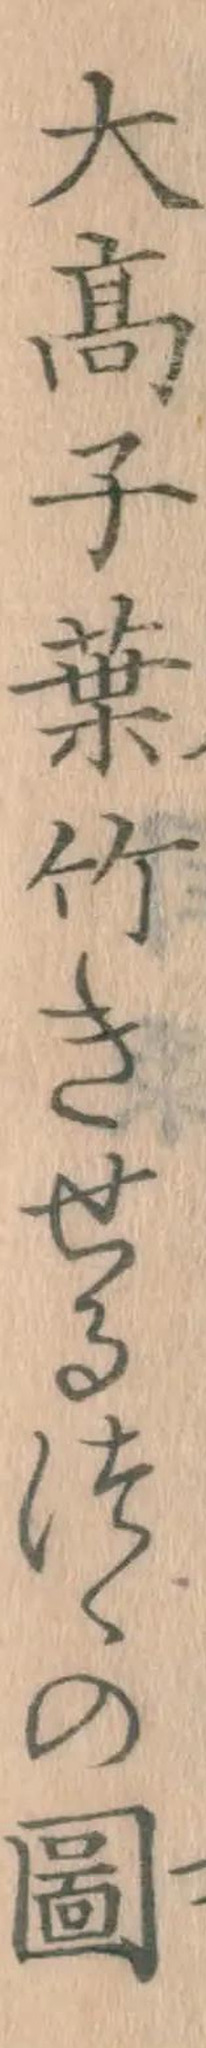大高子葉竹きせるつゝの図
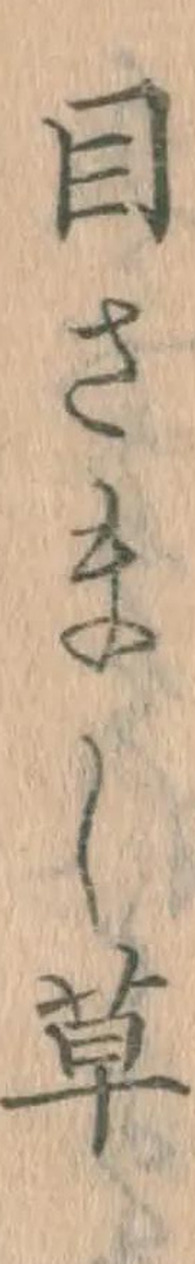目さまし草
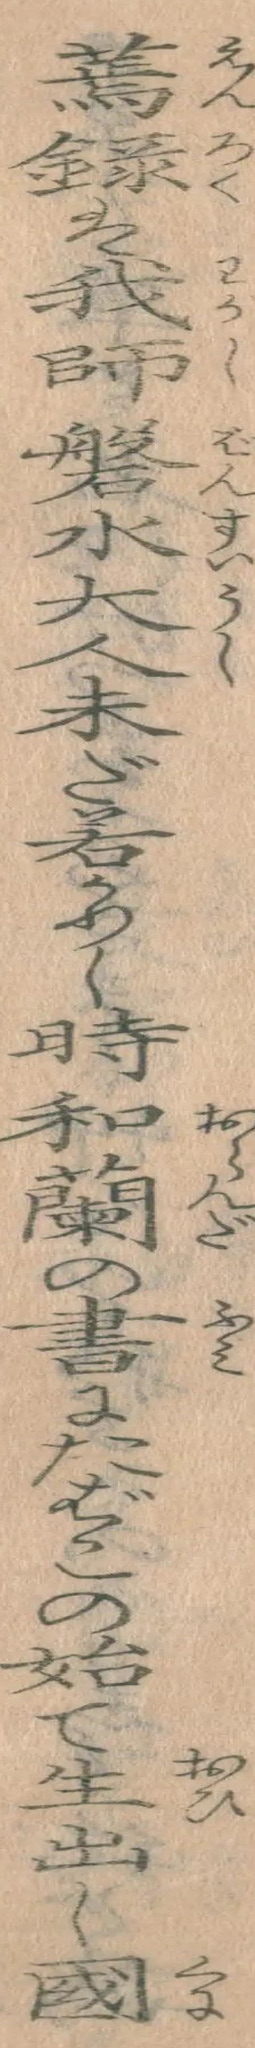蔫録は我師磐水大人未だ若かりし時和蘭の書にたばこの始て生出し国
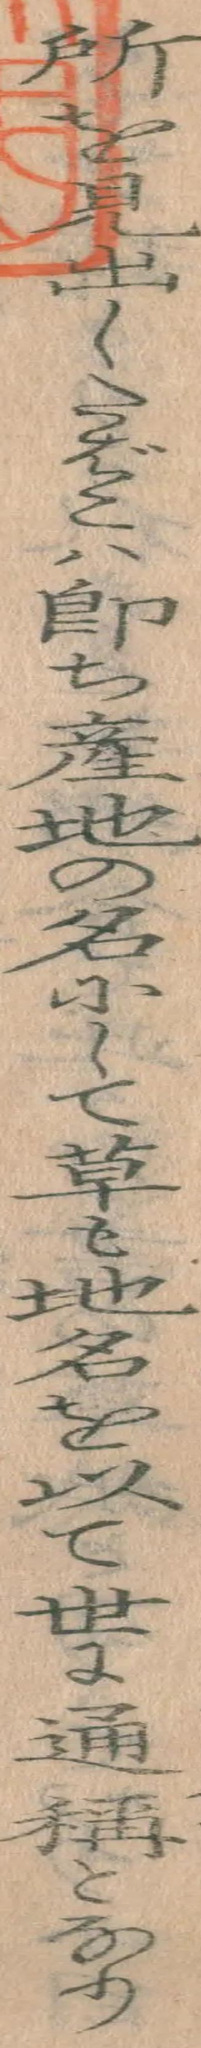所を見出したばこは即ち産地の名にして草も地名を以て世に通称となり
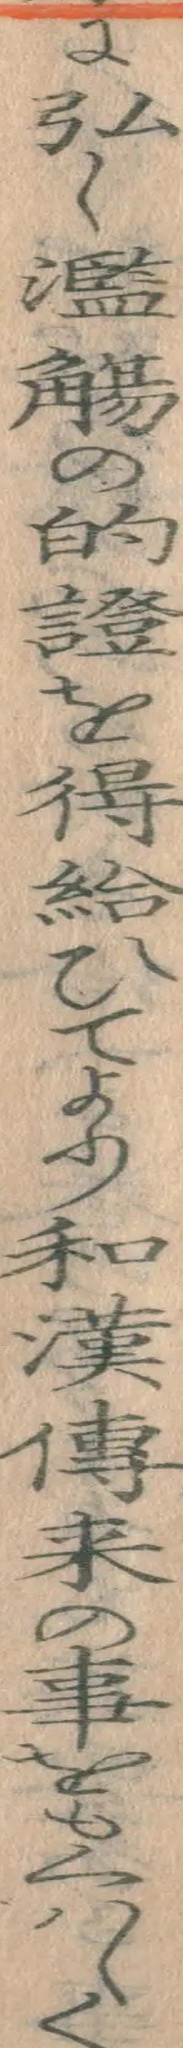かく世界に弘し濫觴の的証を得給ひてより和漢伝来の事をもくはしく
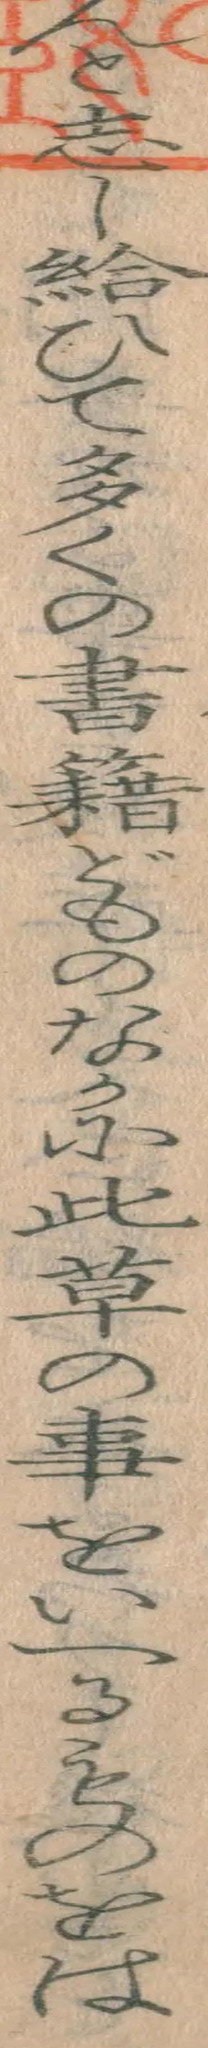集んと志し給ひて多くの書籍どものなかに此草の事をいへるものをは
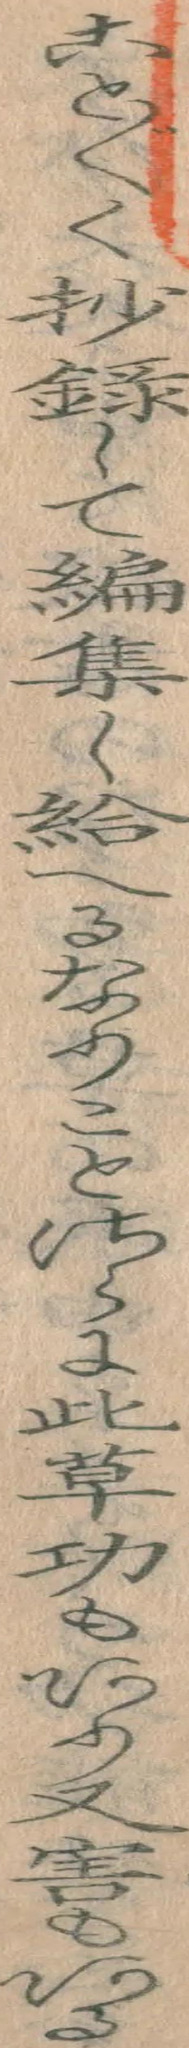こと〴〵く抄録して編集し給へるなりことさらに此草功もあり又害もある
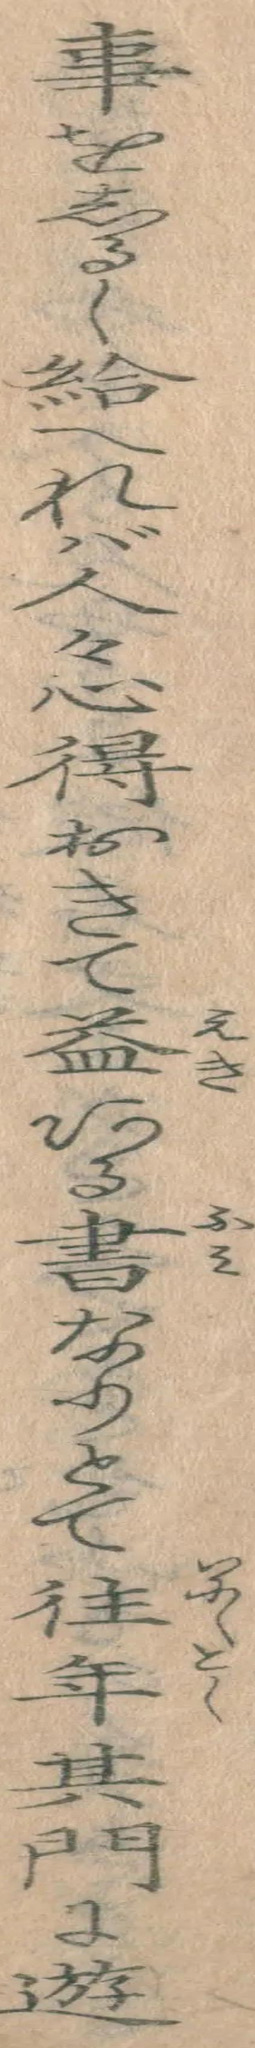事をしるし給へれば人々心得おきて益ある書なりとて往年其門に遊
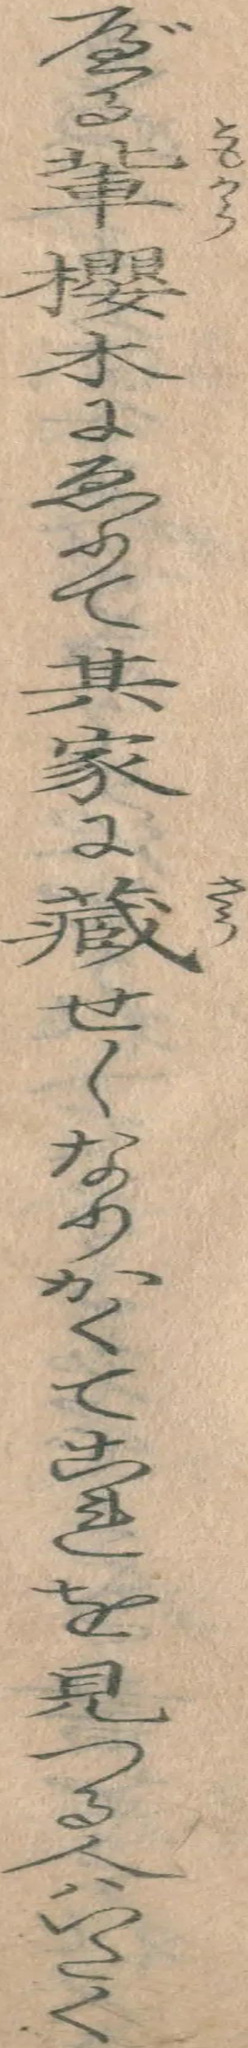べる輩桜木にゑりて其家に蔵せしなりかくてこれを見つる人はいたく
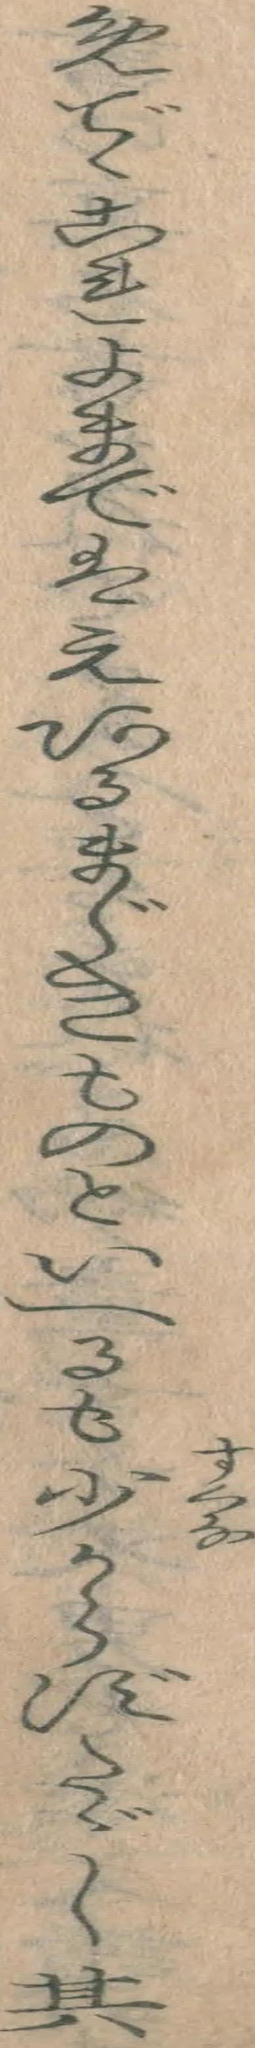めでゝこれよまではえあるまじきものといへるも少からずたゞし其

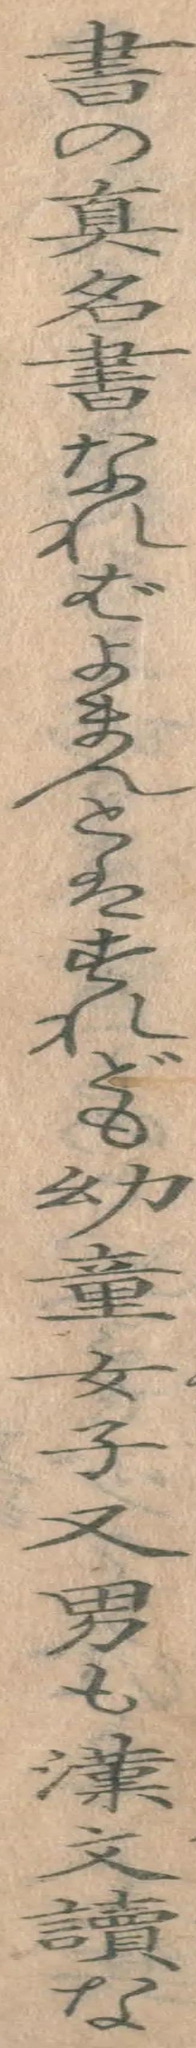書の真名書なればよまんとはすれども幼童女子又男も漢文読な
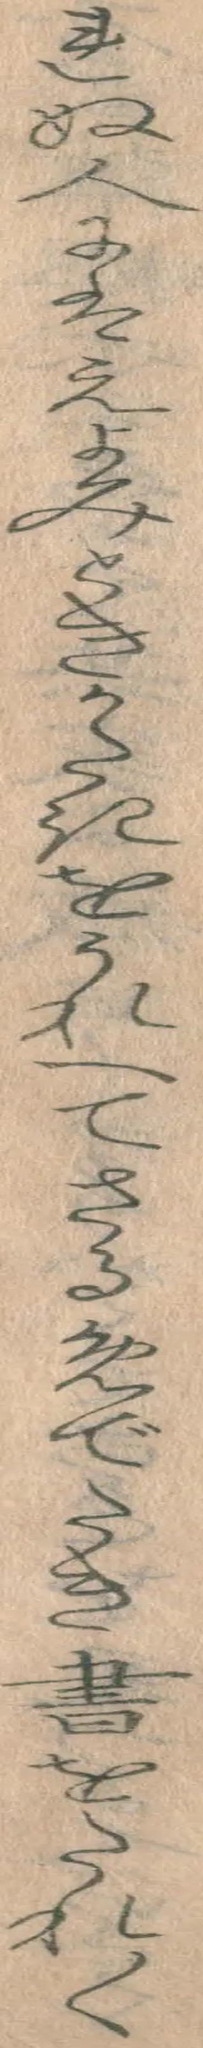れぬ人にはえよみときかたきをうれへてさるめでたき書をたれ〳〵
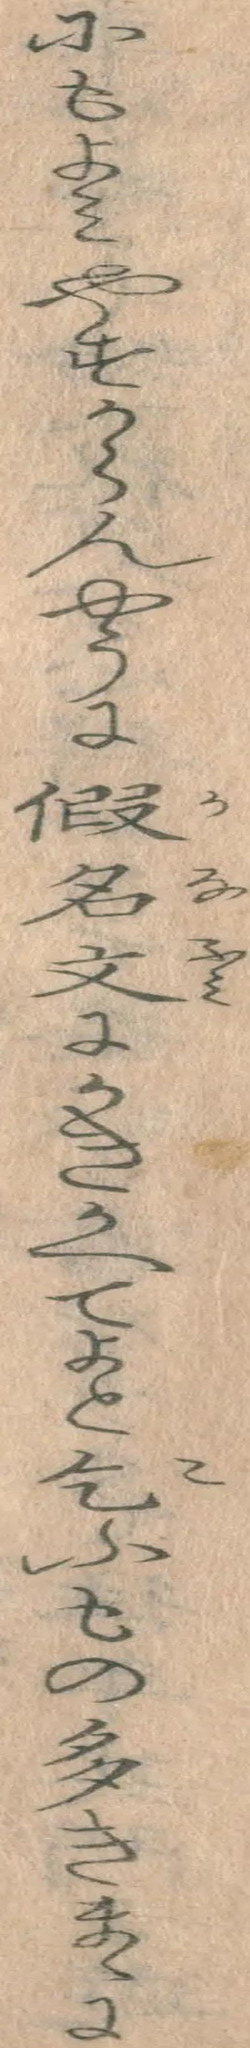にもよみやすからんやうな仮名文にかきかへてよと乞ふもの多きまゝに
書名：目さまし草
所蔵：国立国会図書館 National Diet Library, JAPAN
